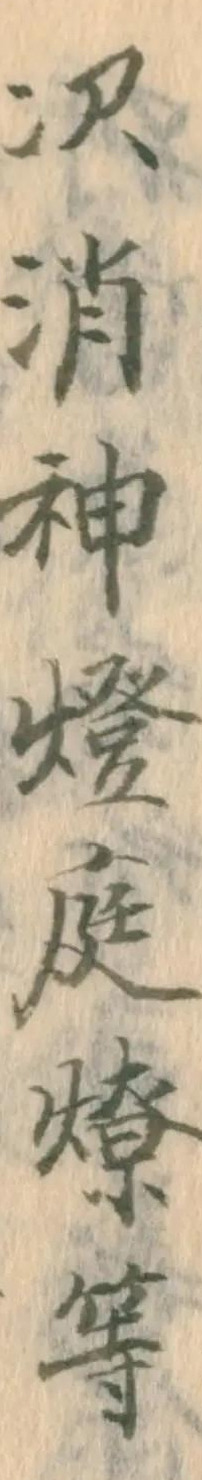次消神燈庭燎等
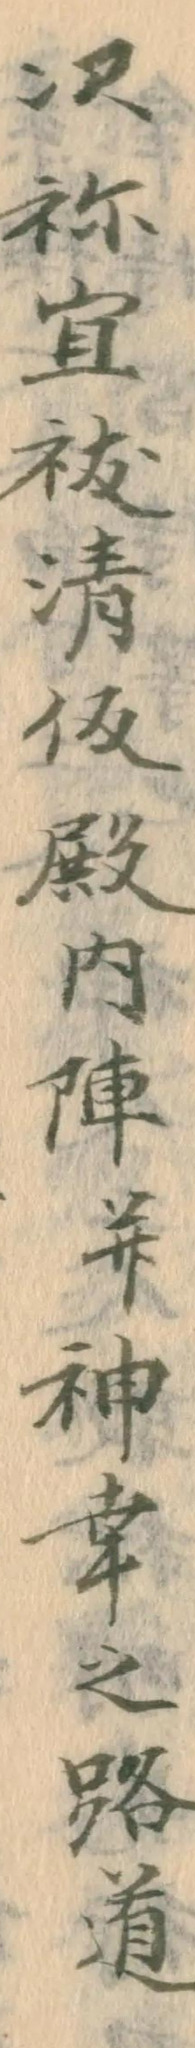次祢宜祓清仮殿内陣并神幸之路道
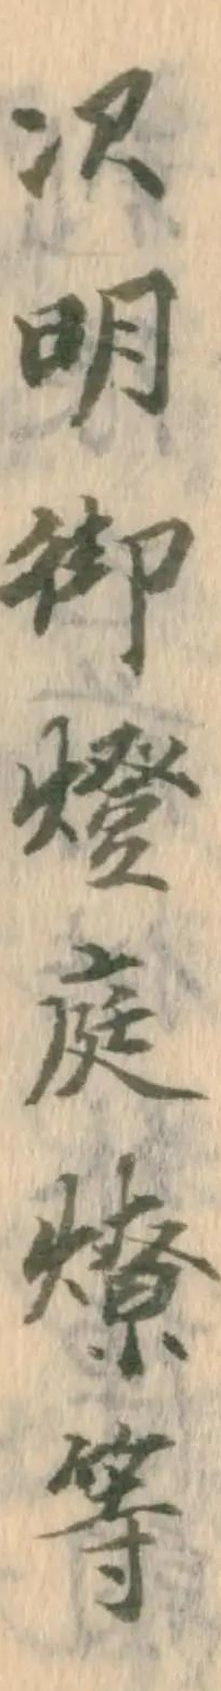次明御燈庭燎等
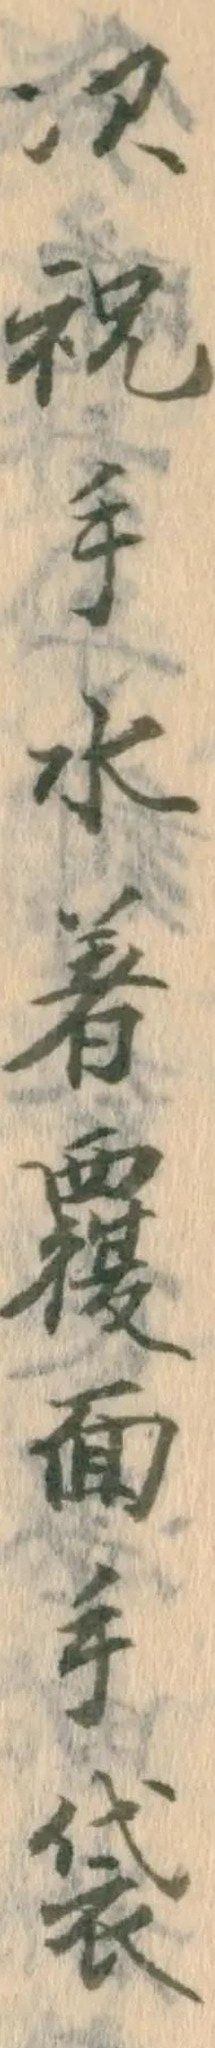次祝手水着覆面手袋
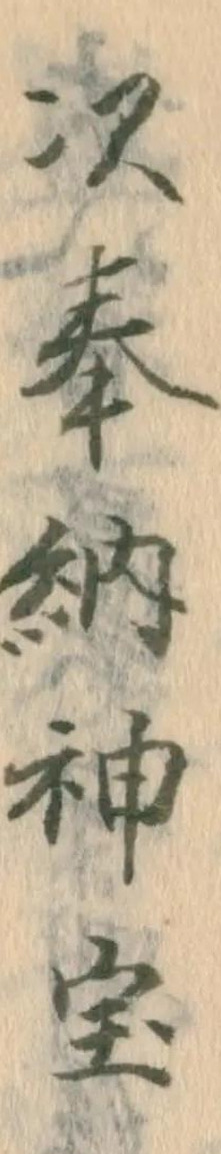次奉納神宝
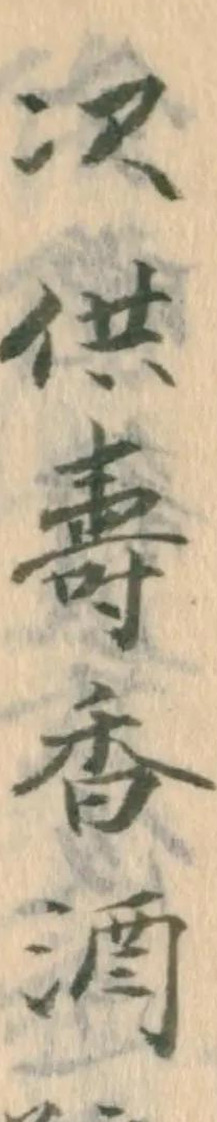次撤寿香酒
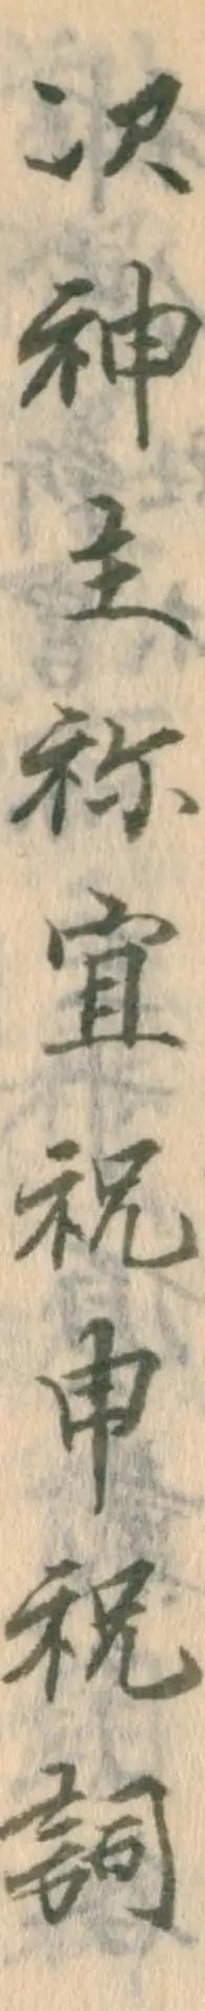次神主祢宜祝申祝詞
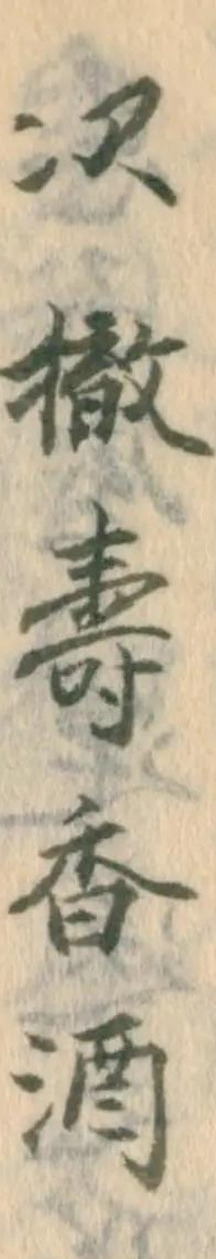次撤寿香酒
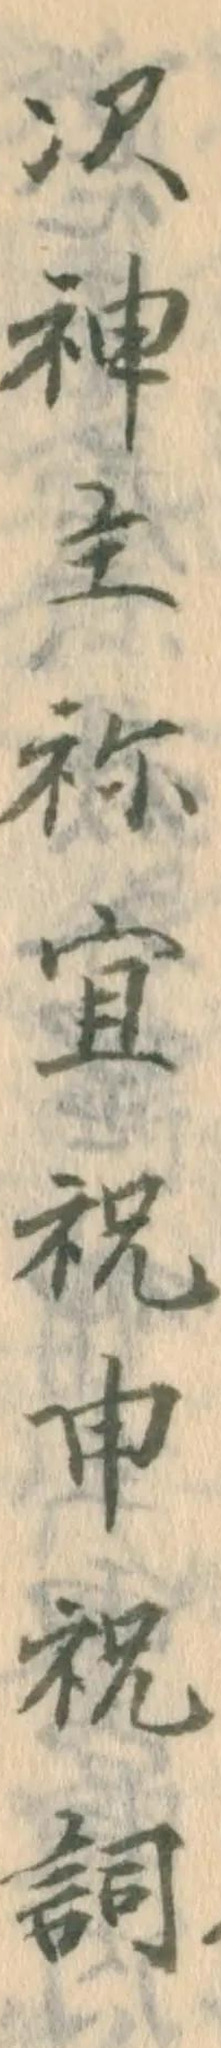次神主祢宜祝申祝詞
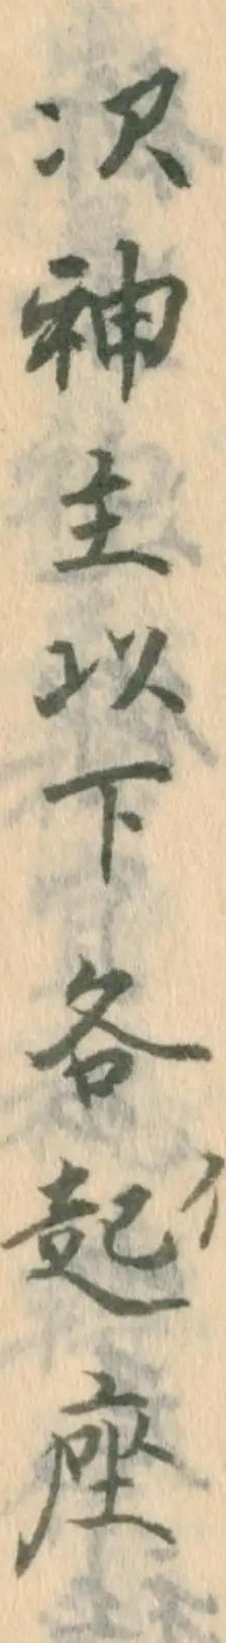次神主以下各起座

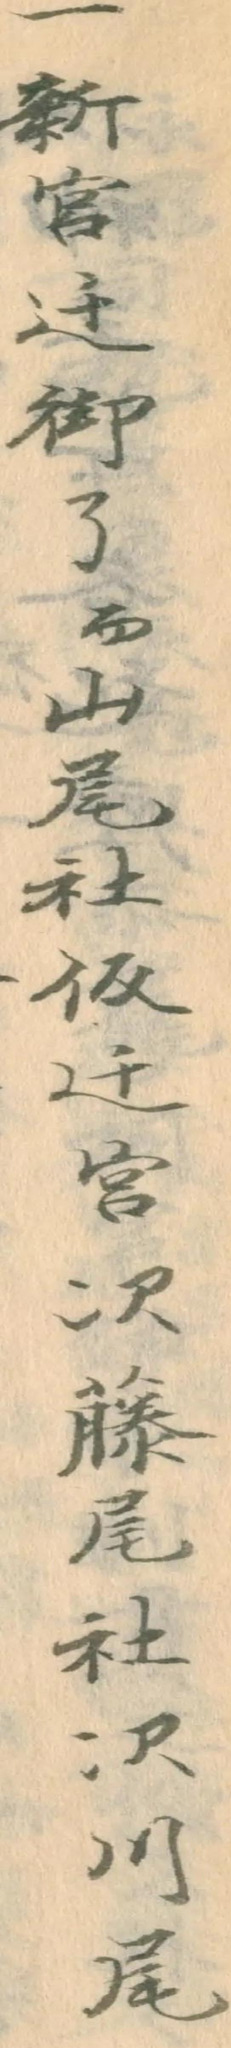一新宮迁御了而山尾社仮迁宮次藤尾社次川尾
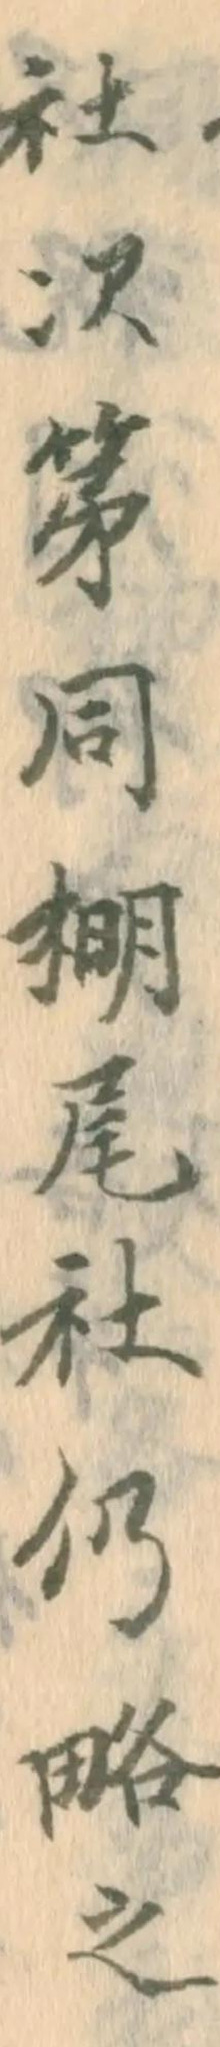社次第同棚尾社仍略之
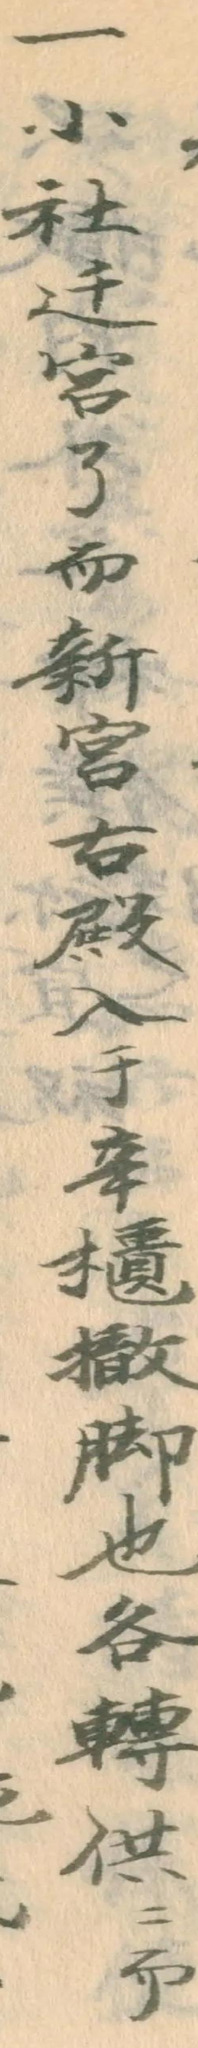一小社迁宮了而新宮古殿入于辛櫃撤脚也各転供ニ而
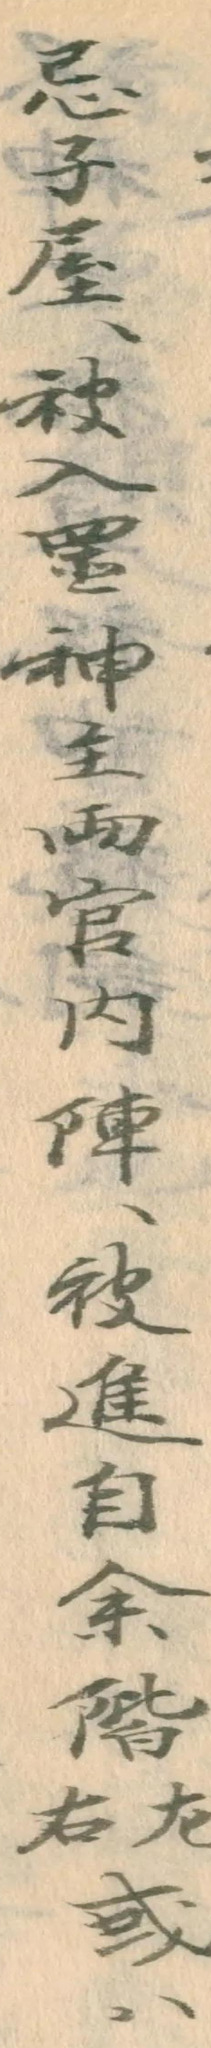忌子屋ヘ被入置神主両官内陣ヘ被進自余階左右或ハ
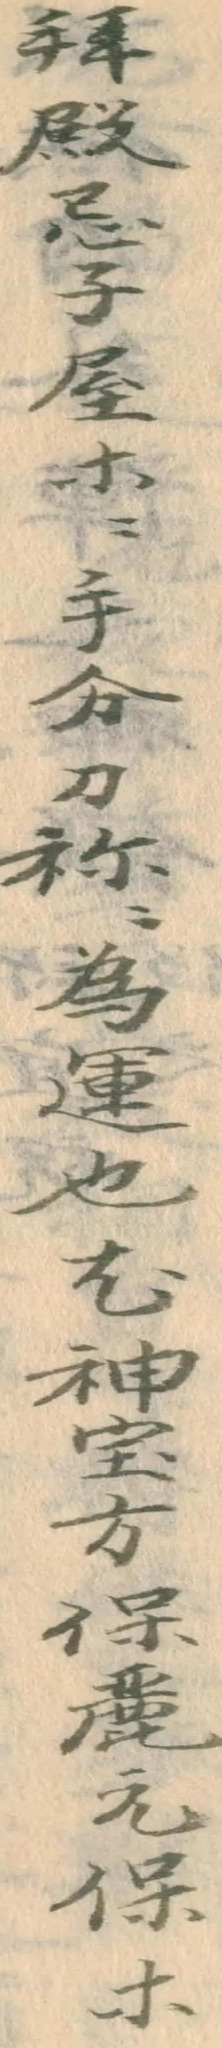拝殿忌子屋等ニ手分刀祢ニ為運也尤神宝方保麗元保等
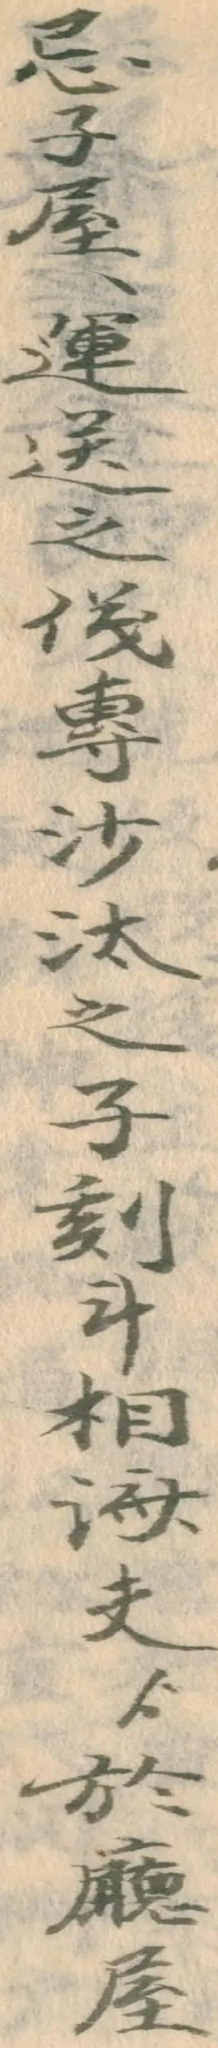忌子屋ヘ運送之儀専沙汰之子刻計相済夫ゟ於庁屋
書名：賀茂社記録. 第17冊
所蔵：国立国会図書館 National Diet Library, JAPAN
